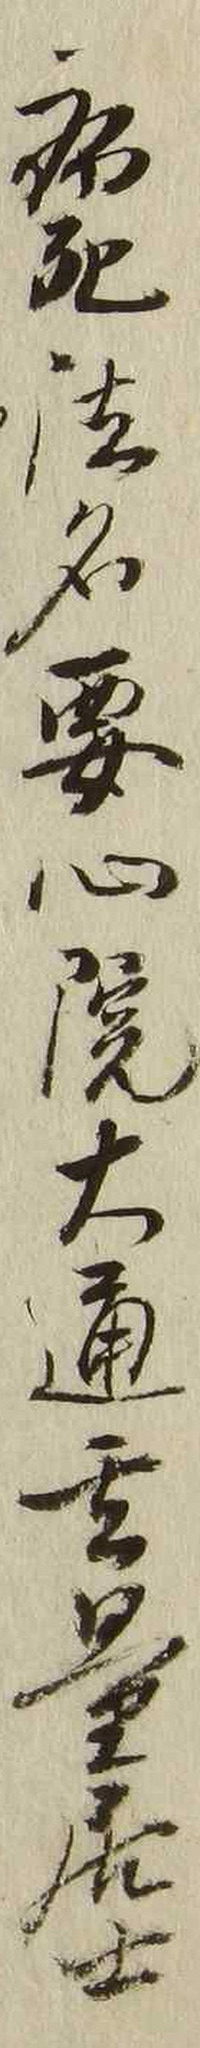病死法名要心院大通玄量居士
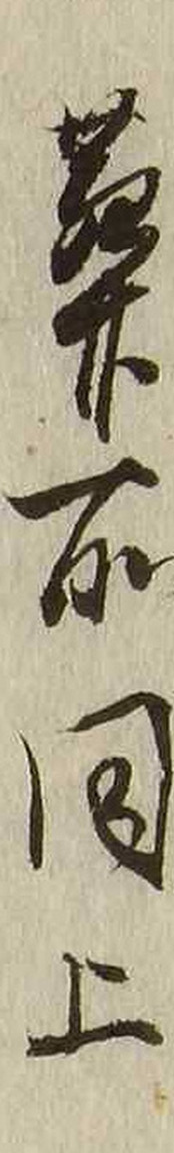葬所同上
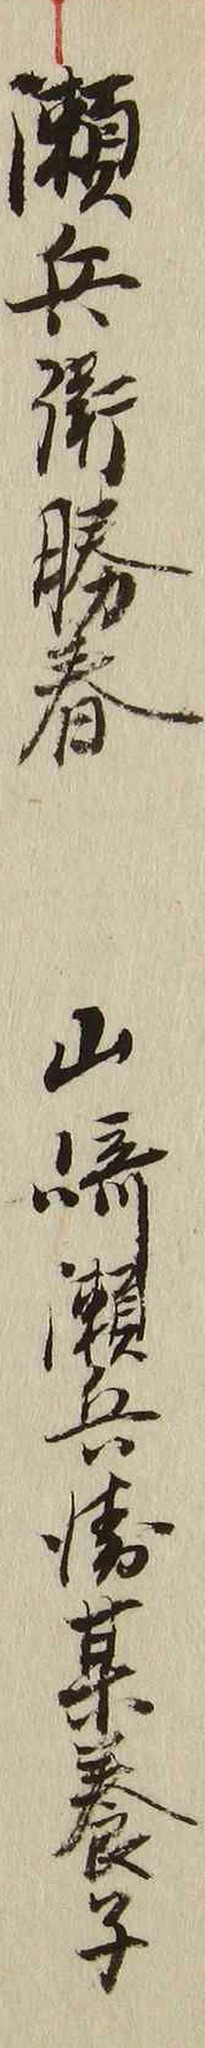瀬兵衛勝春山崎瀬兵衛某養子
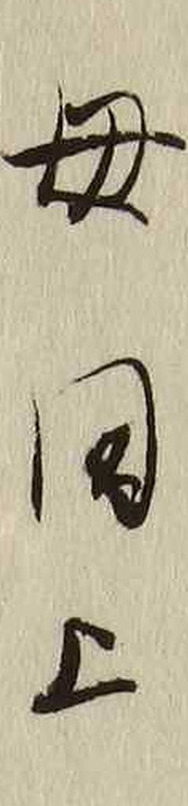母同上
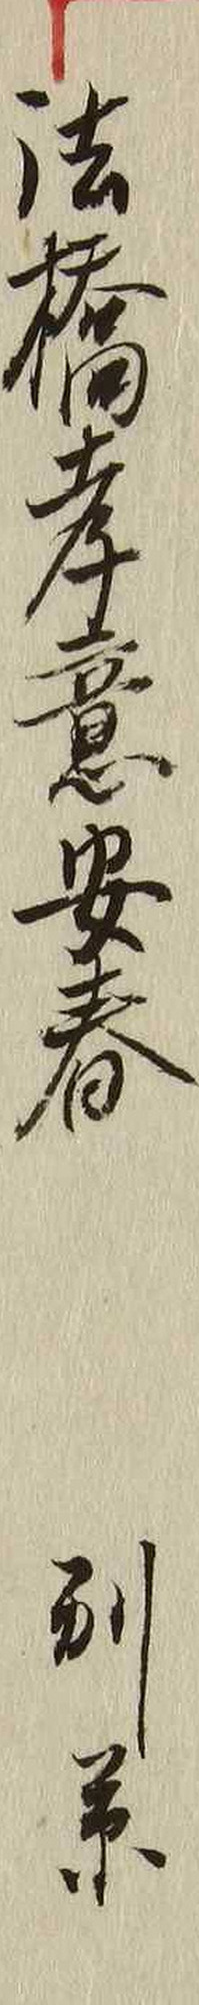法橋孝意安春別系
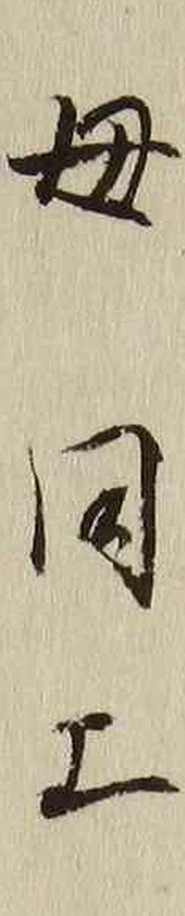母同上
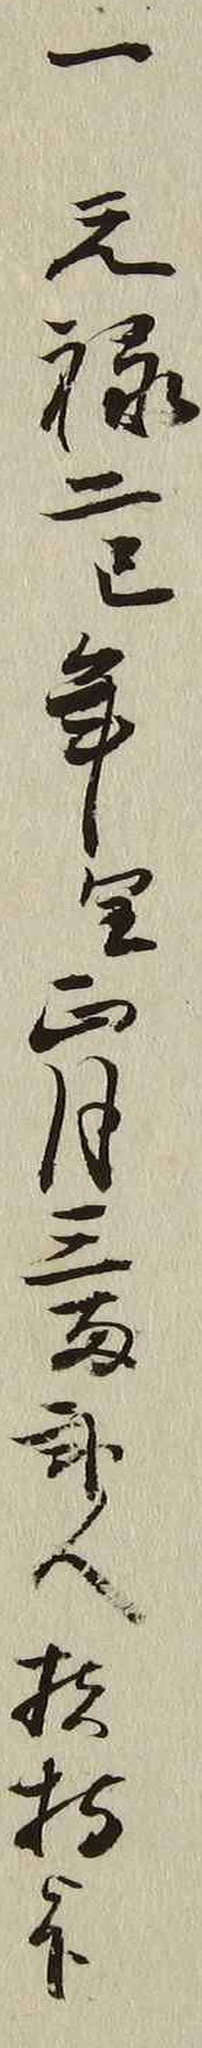一元禄二巳年閏正月三両弐人扶持被下
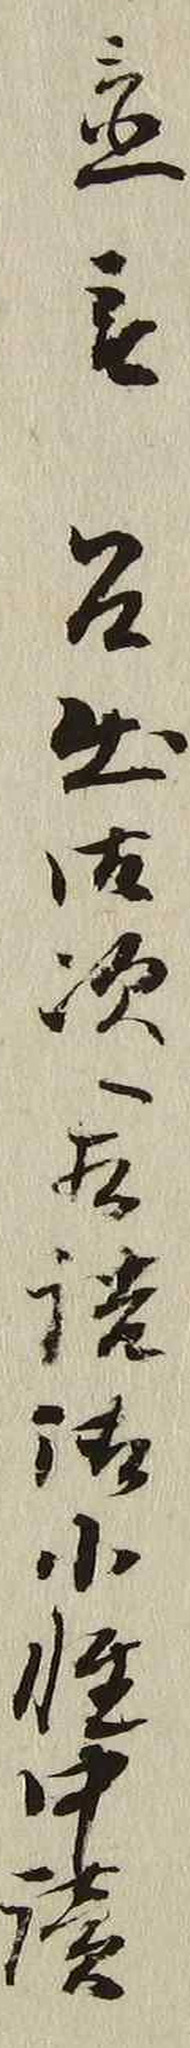置被召出御次へ相詰御小性中読
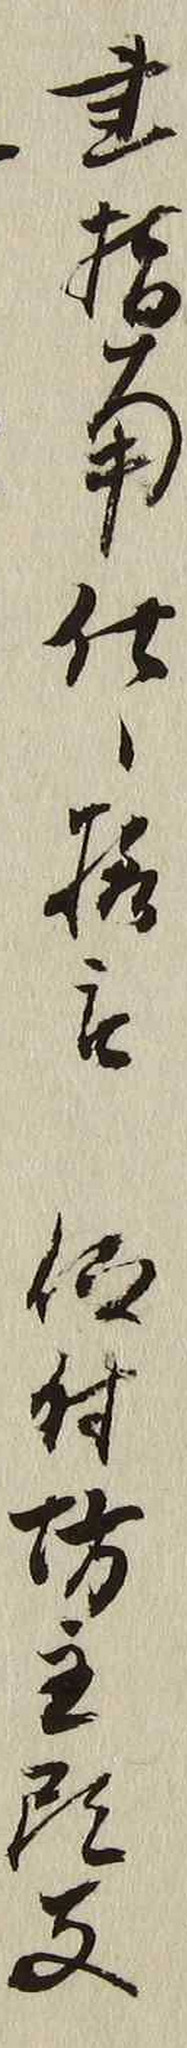書指南仕候様被仰付坊主頭支
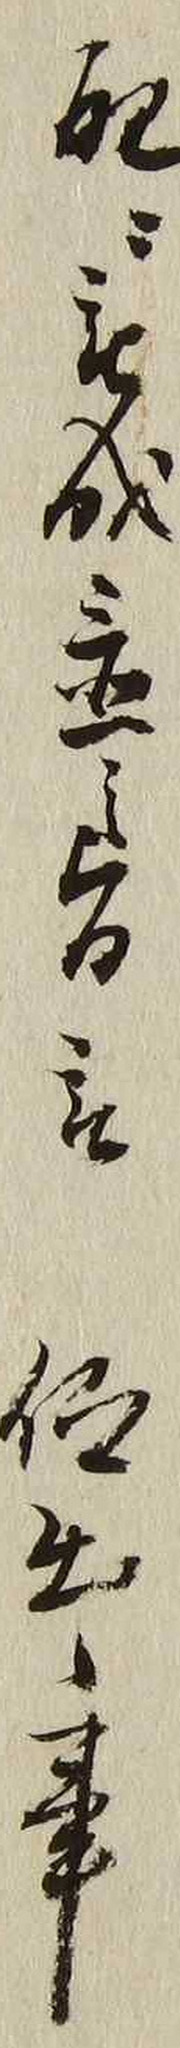配ニ被成置之旨被仰出候事
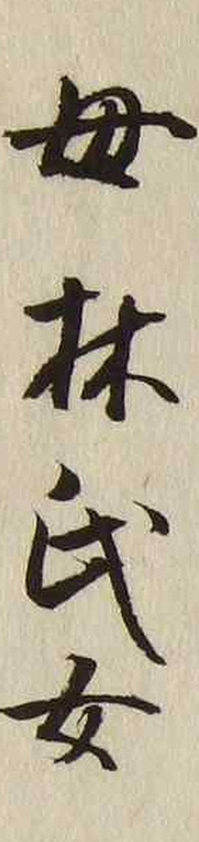母林氏女

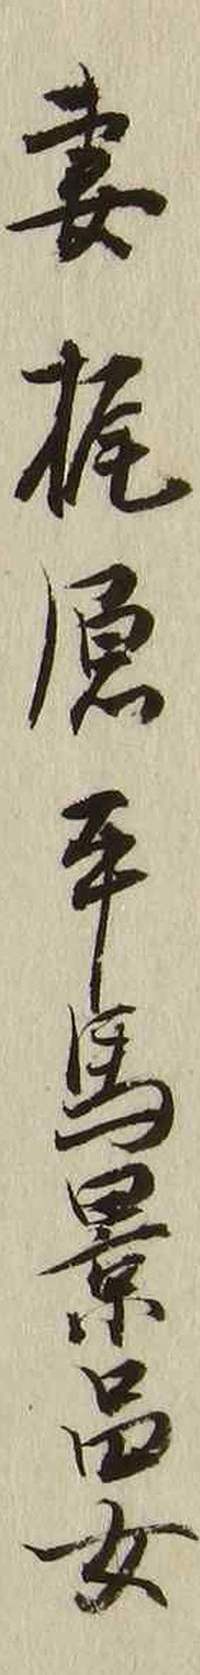妻梶原平馬景品女
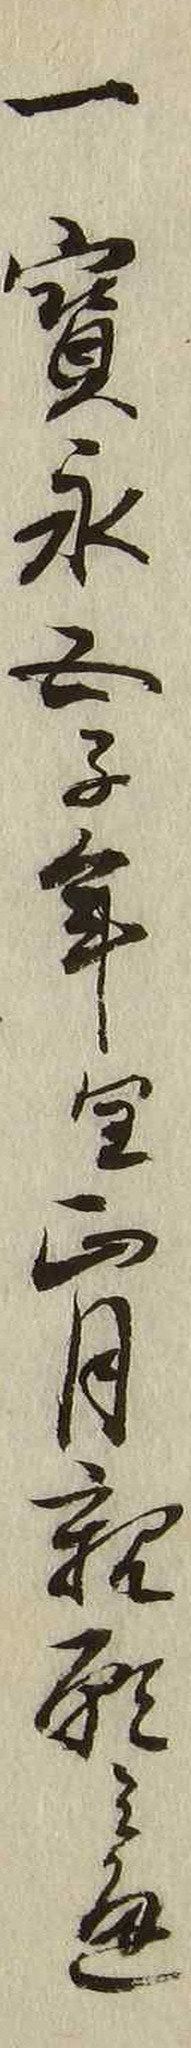一宝永五子年閏正月親願之通
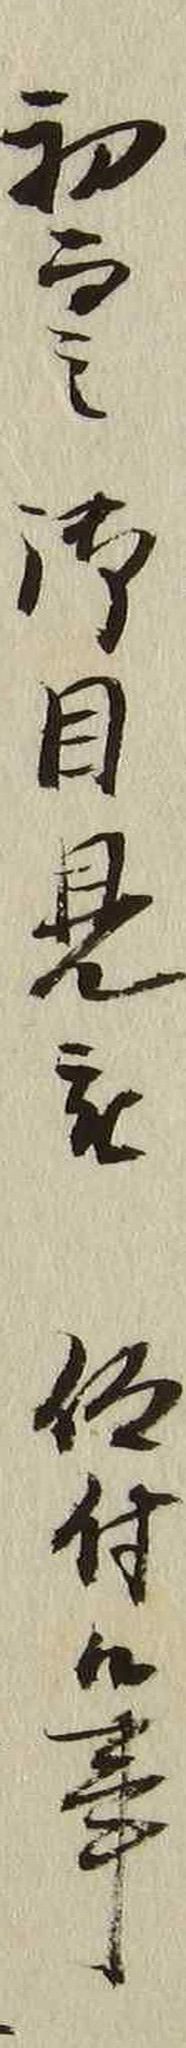初而之御目見被仰付候事
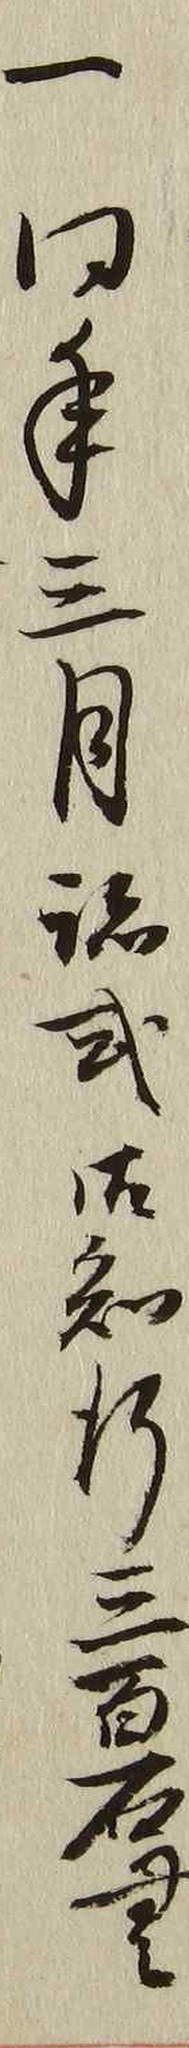一同年三月跡式御知行三百石無
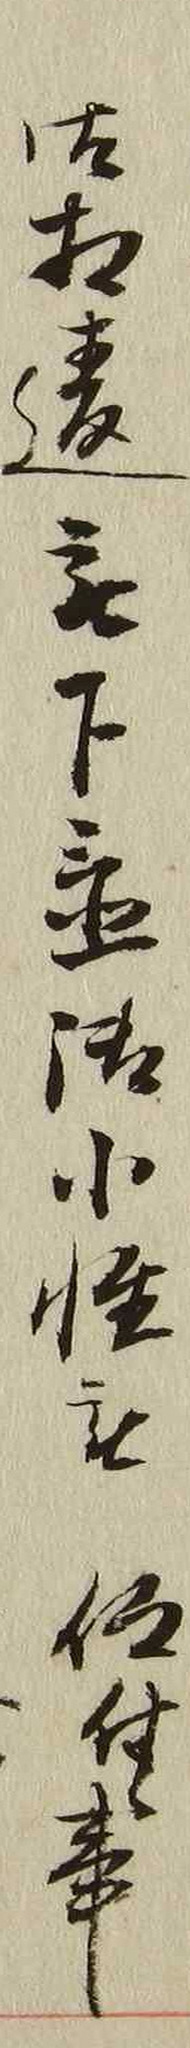御相違被下置御小性被仰付候事
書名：諸士系譜　巻之348　も之部4
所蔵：会津若松市立会津図書館
